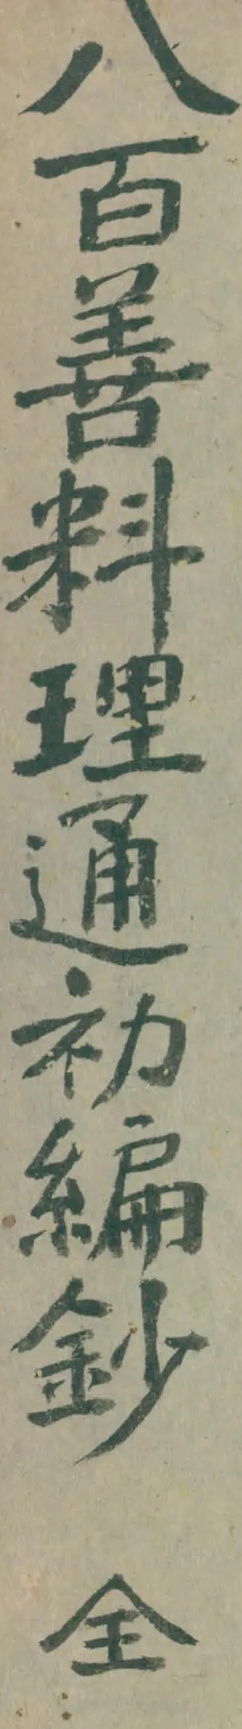八百善料理通初編鈔全
